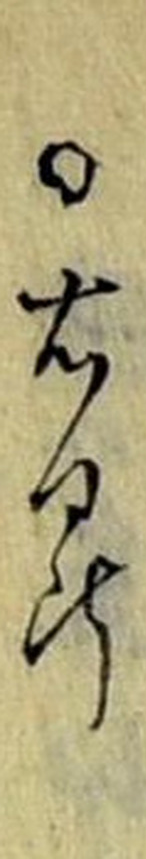○右同断
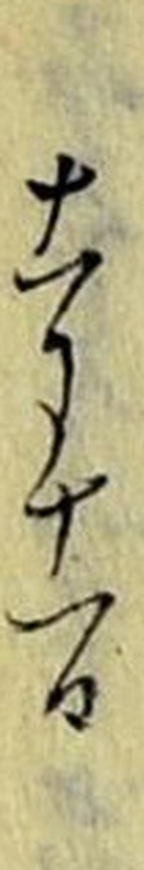十一月十一日
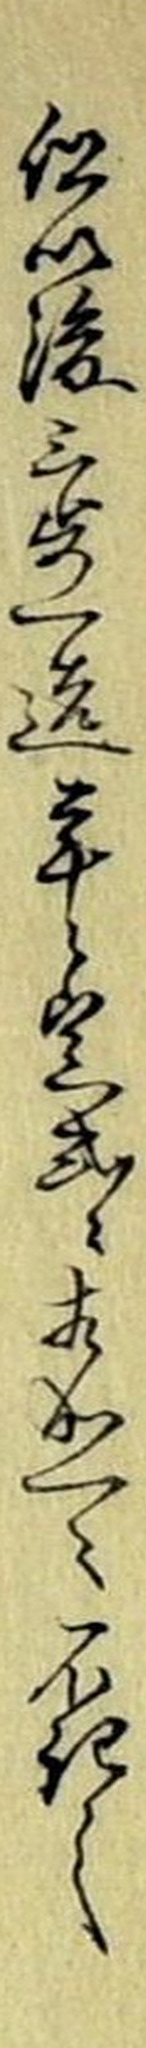但以後三歩一造年々定式に相成可不限之

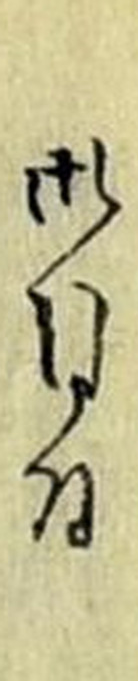御目付
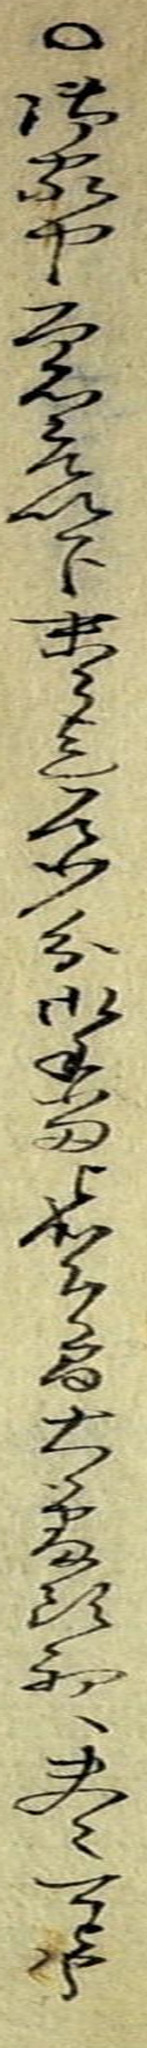○御家中百石取以可末々迄乍少分御手当被成下候間大御番頭初へ夫々可被申
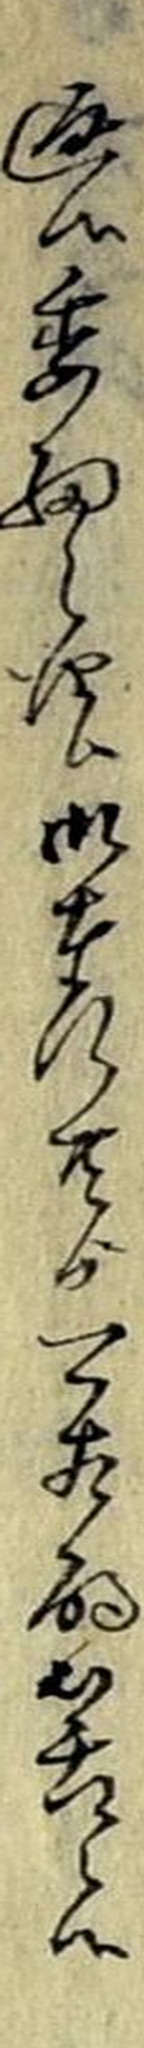通候委細之儀は御奉行共ゟ可相触筈に候
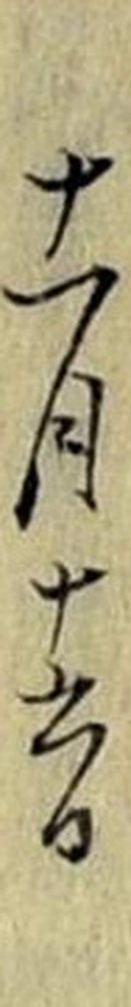十一月十六日
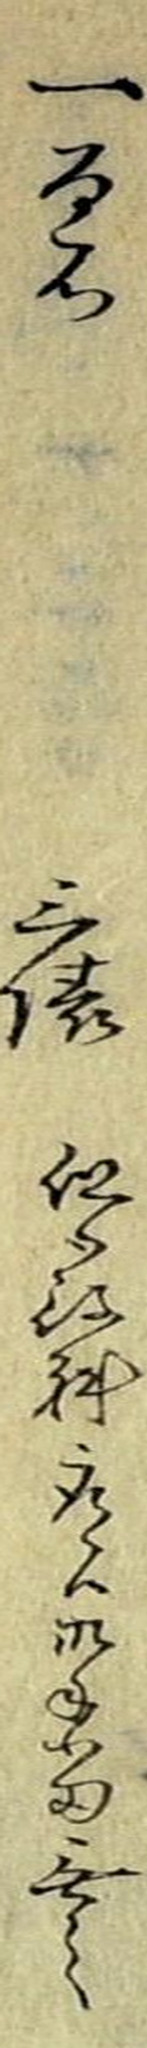一百石三俵但御役料取は御手当無之
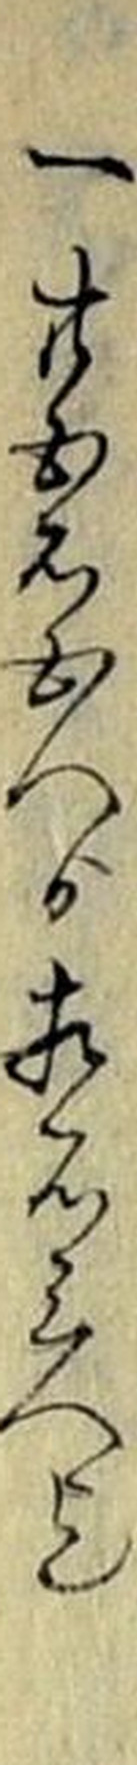一廿五石五人ゟ拾石三人迄弐俵
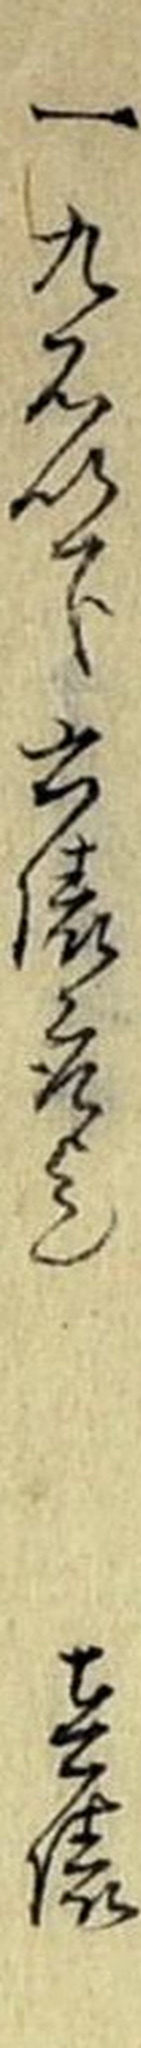一九石以下六俵取迄壱俵
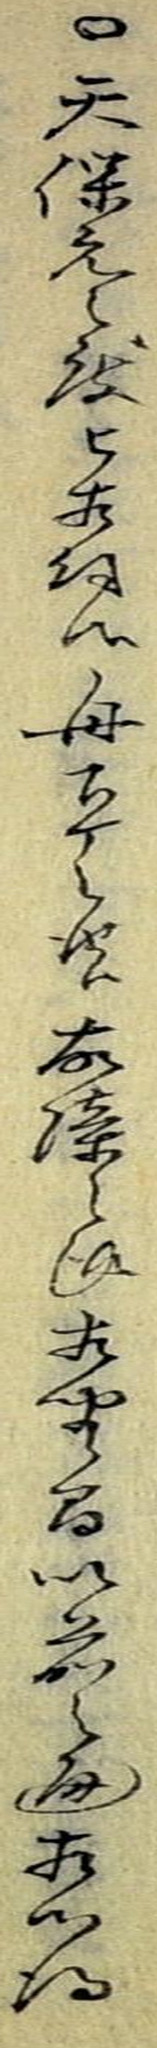○天保元之度被相調候舟下ヶ之儀は故障之趣相聞候間以前之通相心得
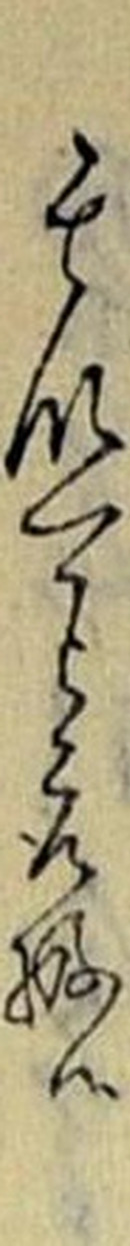其段可被取扱候
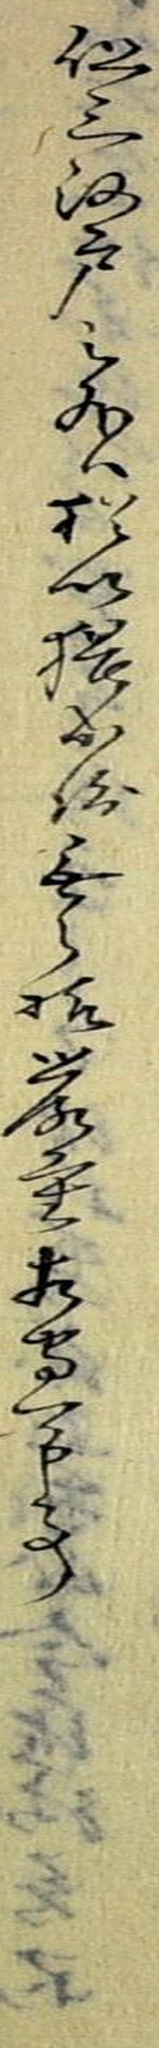但三河戸之外は猶以猥成儀無之様厳重相守可申事
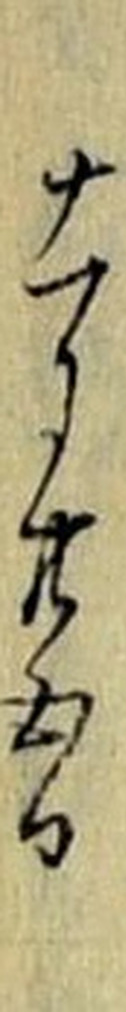十一月廿五日
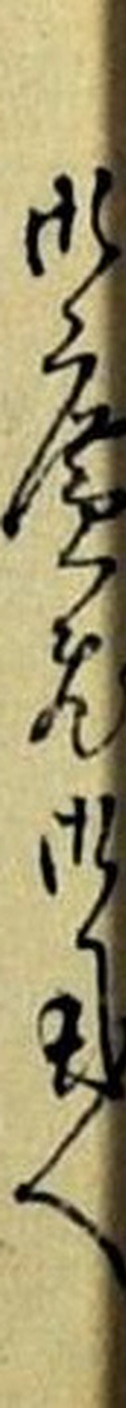御広敷御用人
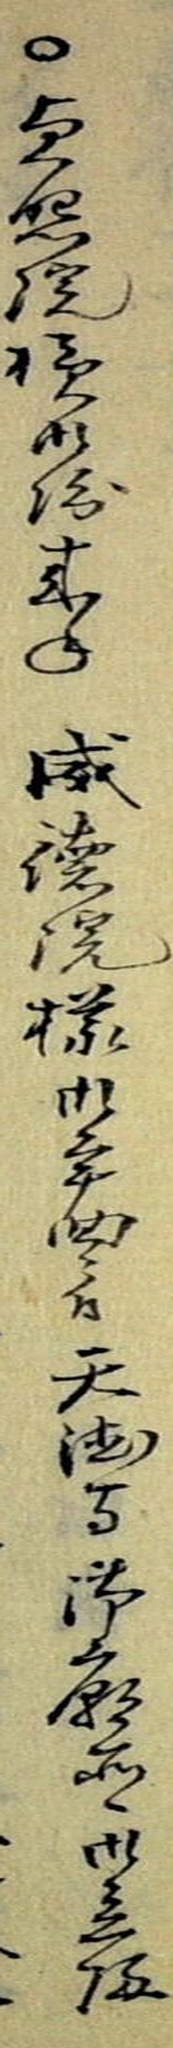○貞照院様御儀来年威徳院御年回に付天徳寺御廟所へ御立帰
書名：命令之部 六
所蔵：福井県文書館 Fukui Prefectural Archives
